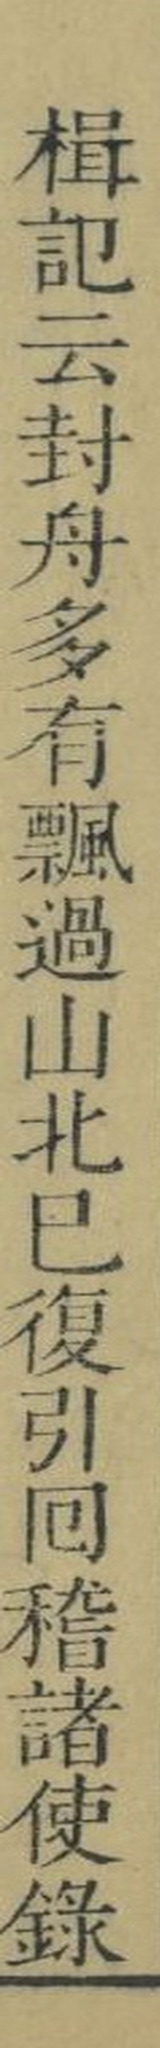楫記云封舟多有飄過山北巳復引囘稽諸使錄
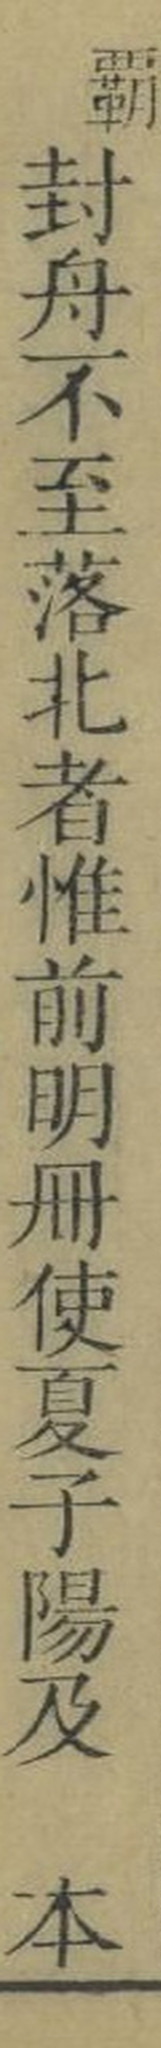覇封舟不至落北者惟前明冊使夏子陽及本
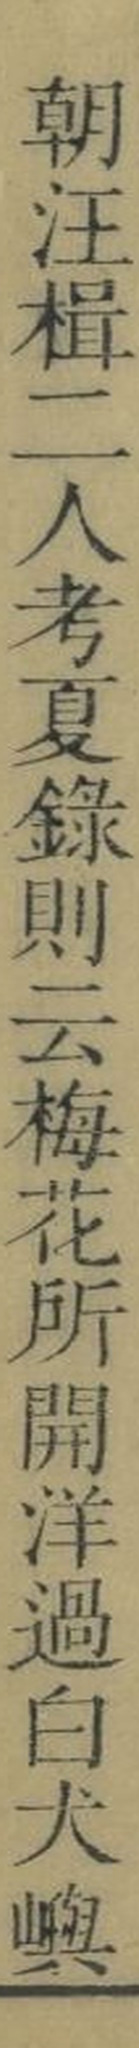朝汪楫二人考夏錄則云梅花所開洋過白犬嶼

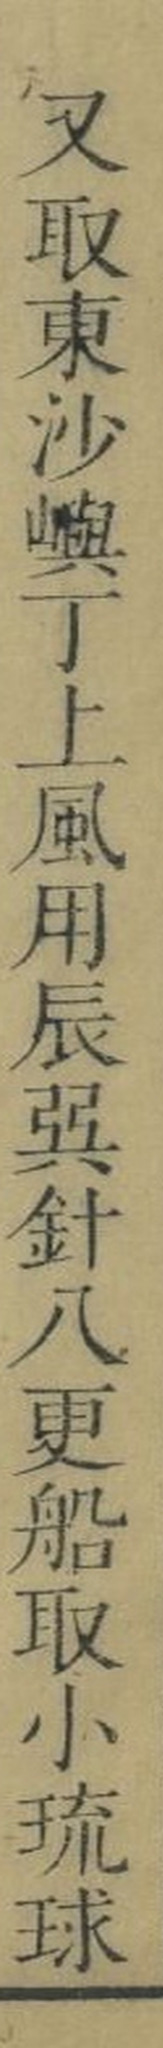又取東沙嶼丁上風用辰㢲針八更船取小琉球
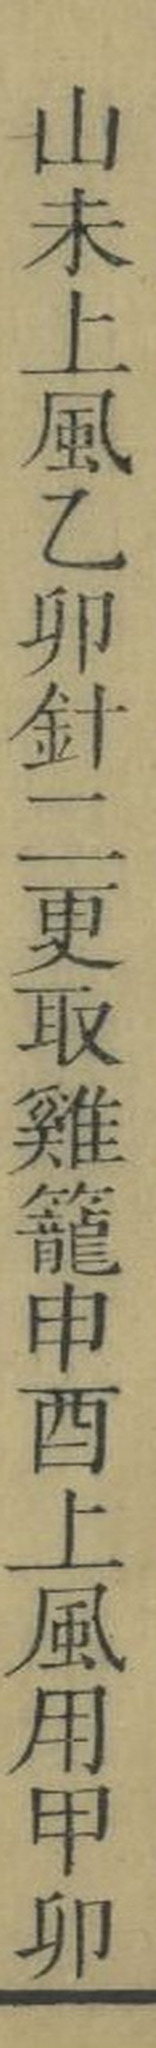山未上風乙卯針二更取雞籠申酉上風用甲卯
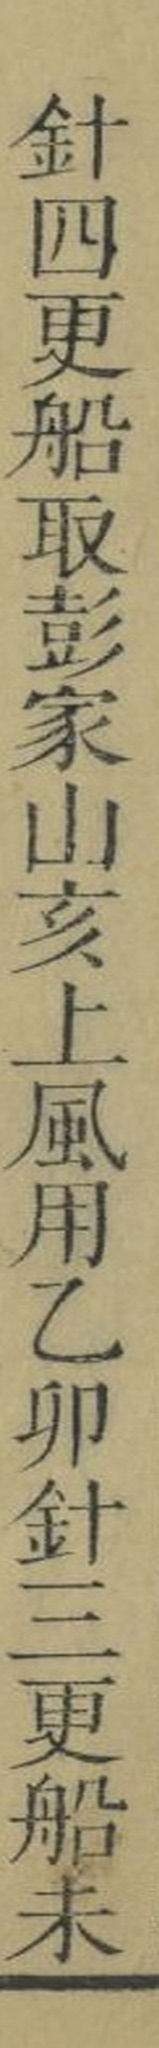針四更船取彭家山亥上風用乙卯針三更船未
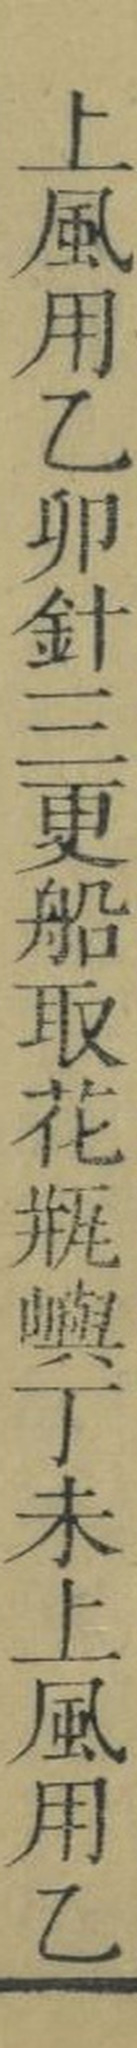上風用乙卯針三更船取花瓶嶼丁未上風用乙
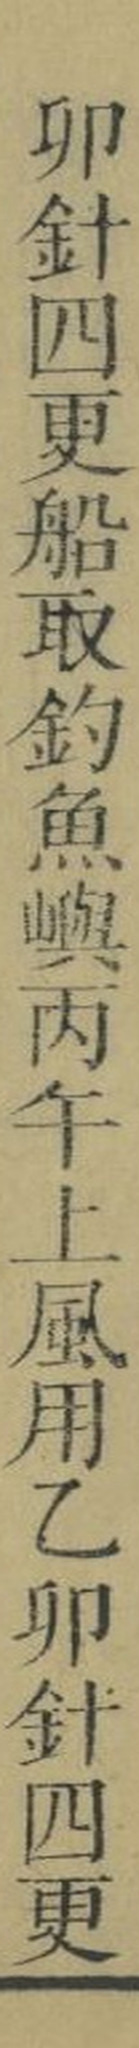卯針四更船取釣魚嶼丙午上風用乙卯針四更
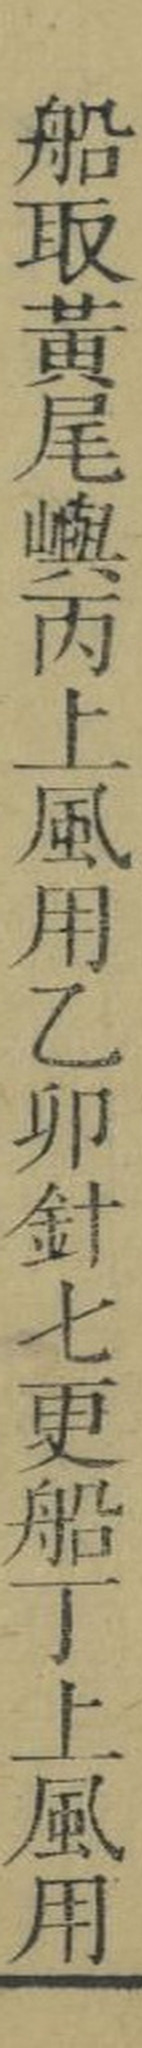船取黃尾嶼丙上風用乙卯針七更船丁上風用
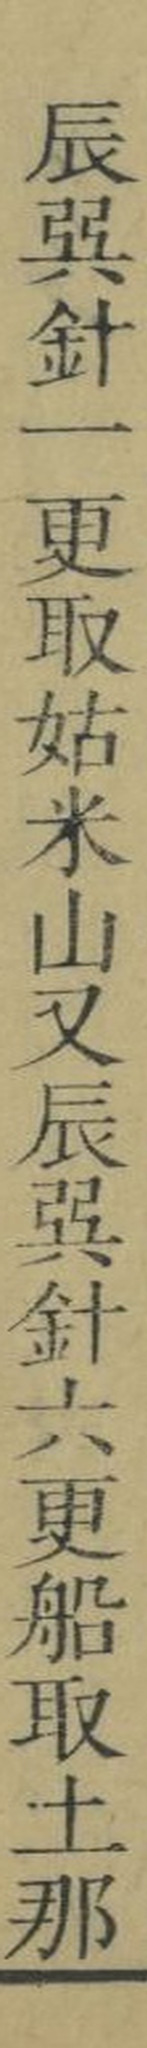辰㢲針一更取姑米山又辰㢲針六更船取土那
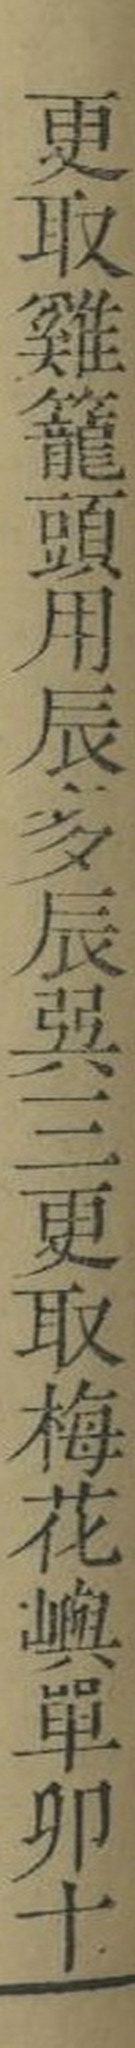更取雞籠頭用辰多辰㢲三更取梅花嶼單卯十
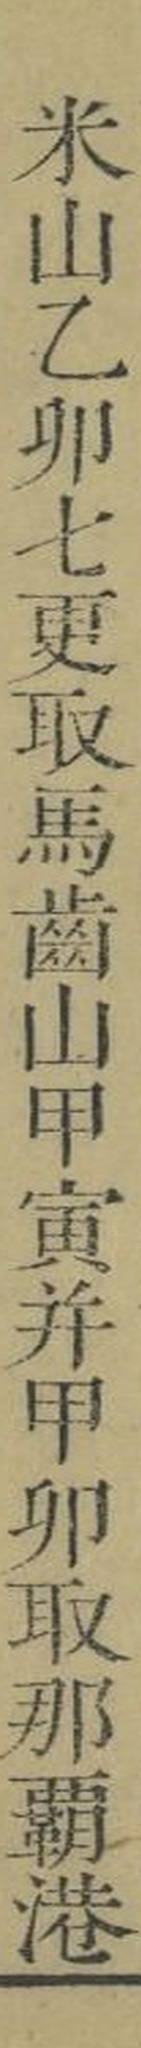米山乙卯七更取馬齒山甲寅并甲卯取那覇港
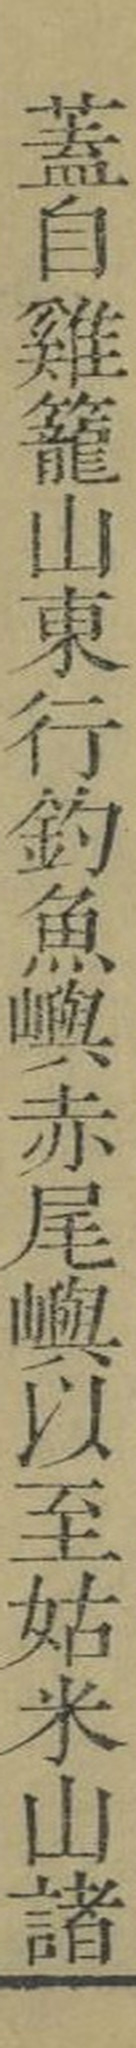蓋自雞籠山東行釣魚嶼赤尾嶼以至姑米山諸
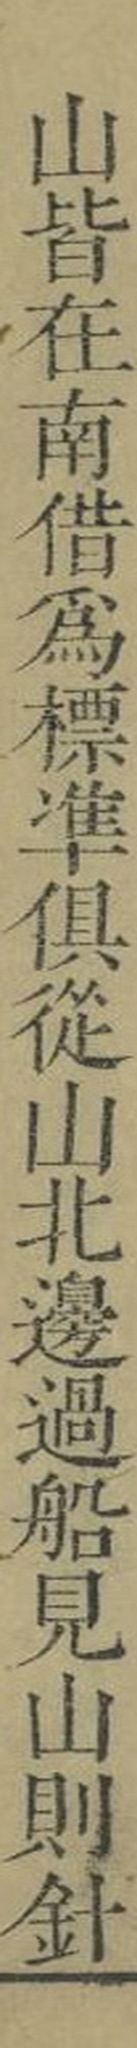山皆在南借爲標準俱從山北邊過船見山則針
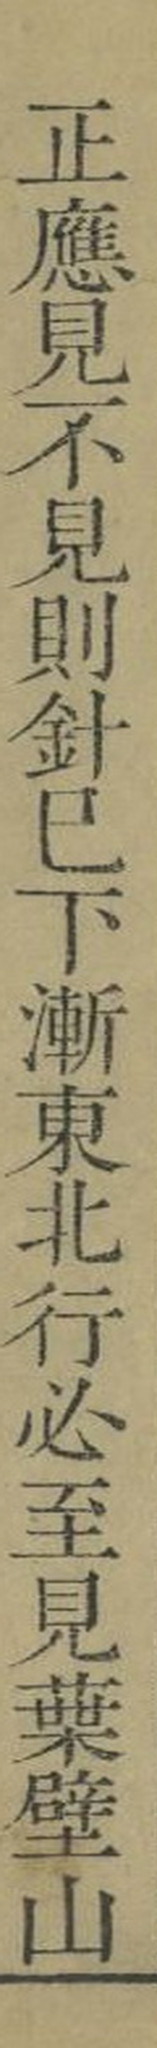正應見不見則針巳下漸東北行必至見葉壁山
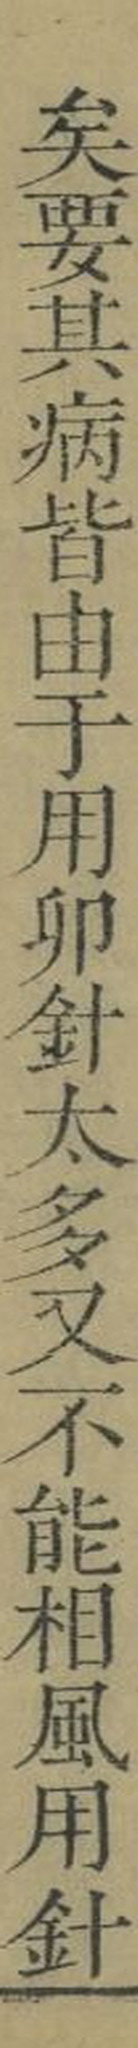矣要其病皆由于用卯針太多又不能相風用針
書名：中山伝信録 巻一
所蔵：University of the Ryukyus Library
